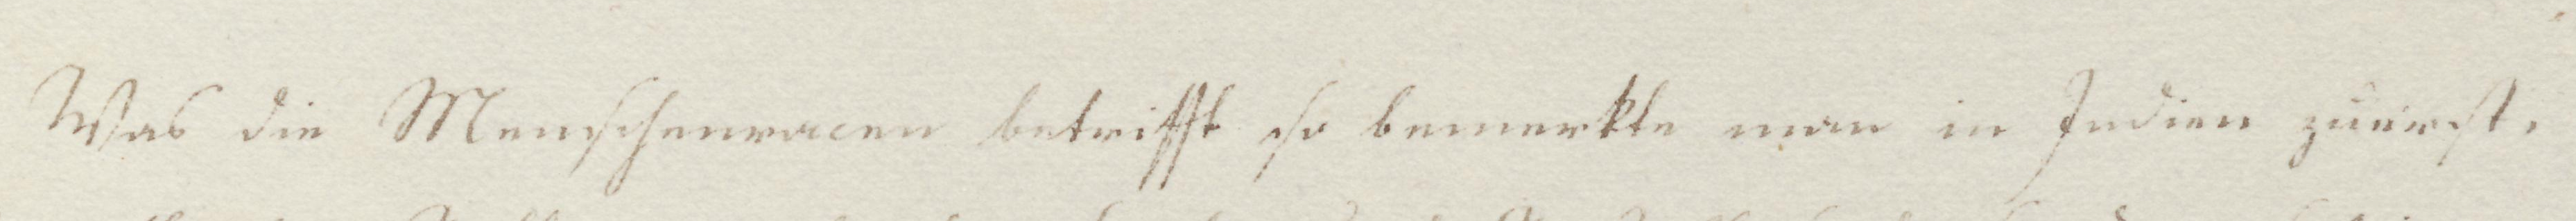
Was die Menschenracen betrifft so bemerkte man in Indien zuerst,
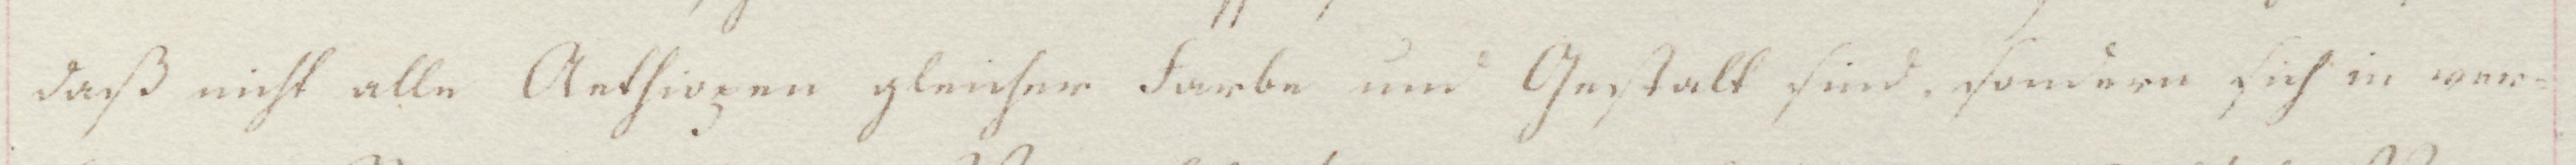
daß nicht alle Aethiopen gleicher Farbe und Gestalt sind, sondern sich in ver-
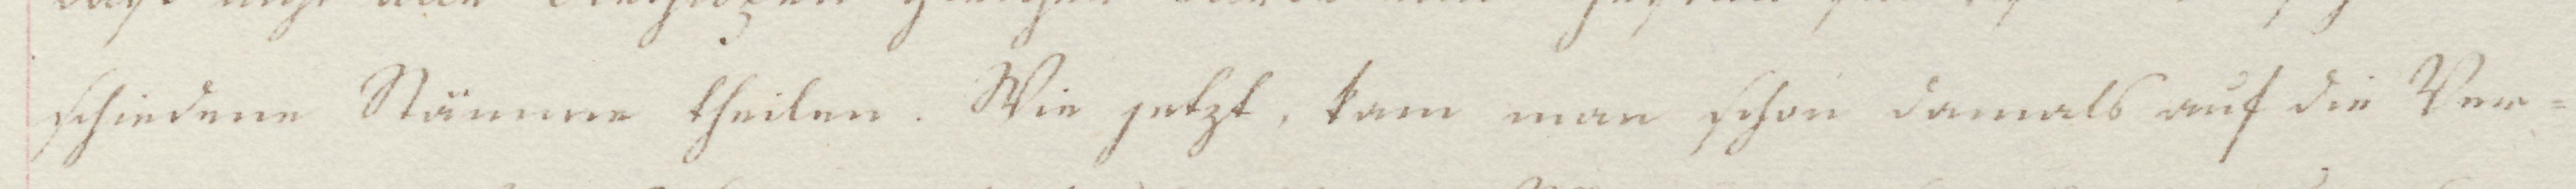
schiedene Stämme theilen. Wie jetzt, kam man schon damals auf die Ver-
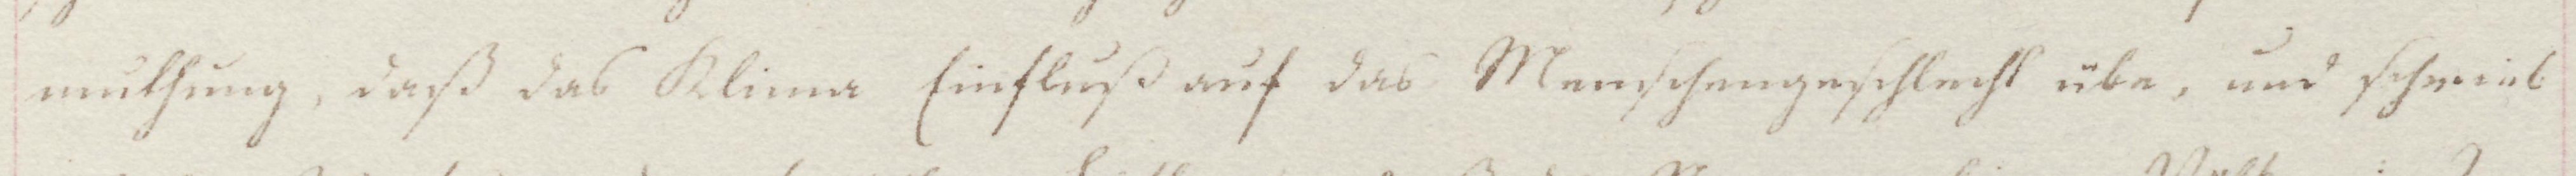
muthung, daß das Klima Einfluß auf das Menschengeschlecht übe, und schrieb
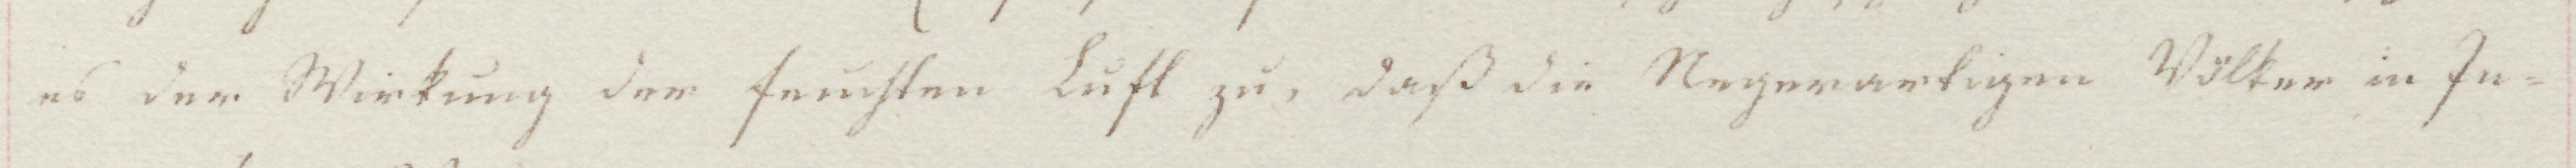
es der Wirkung der feuchten Luft zu, daß die Negerartigen Völker in In-
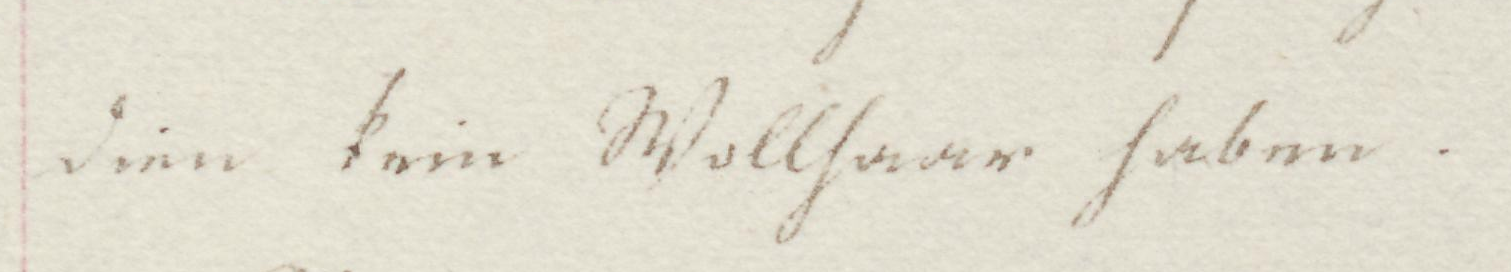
dien kein Wollhaar haben.
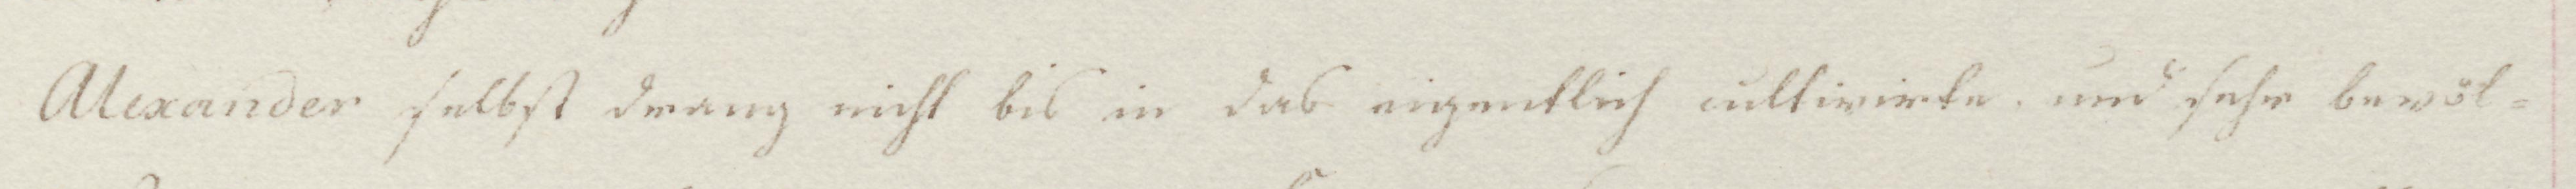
Alexander selbst drang nicht bis in das eigentlich cultivirte und sehr bevöl-
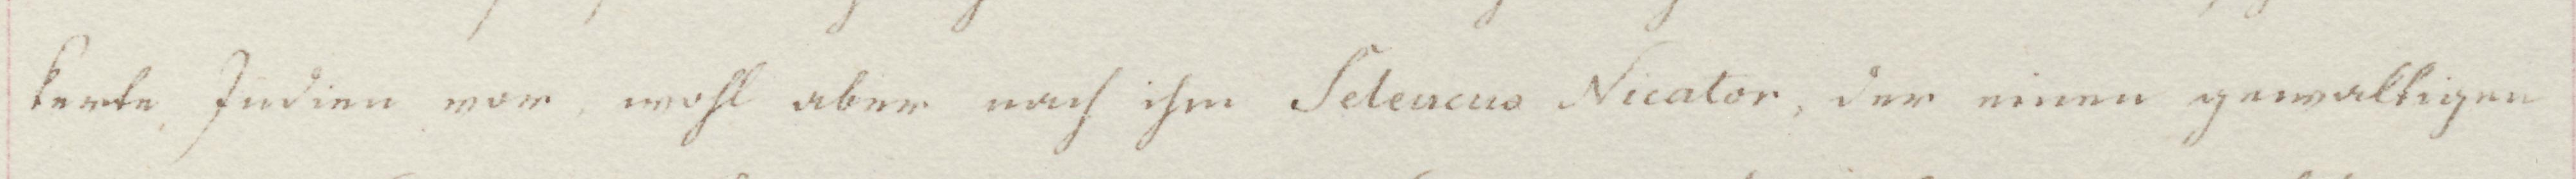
kerte Indien vor, wohl aber nach ihm Seleucus Nicator, der einen gewaltigen
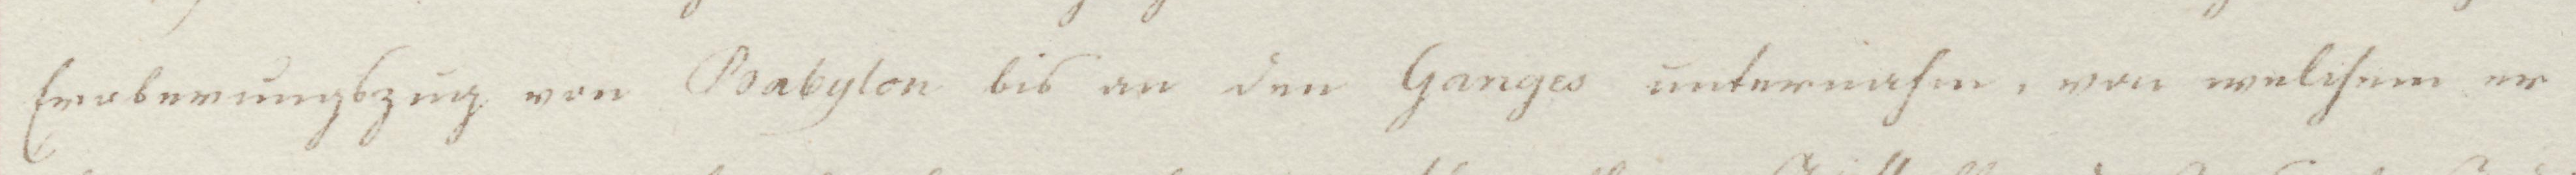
Eroberungszug von Babylon bis an den Ganges unternahm, von welchem er
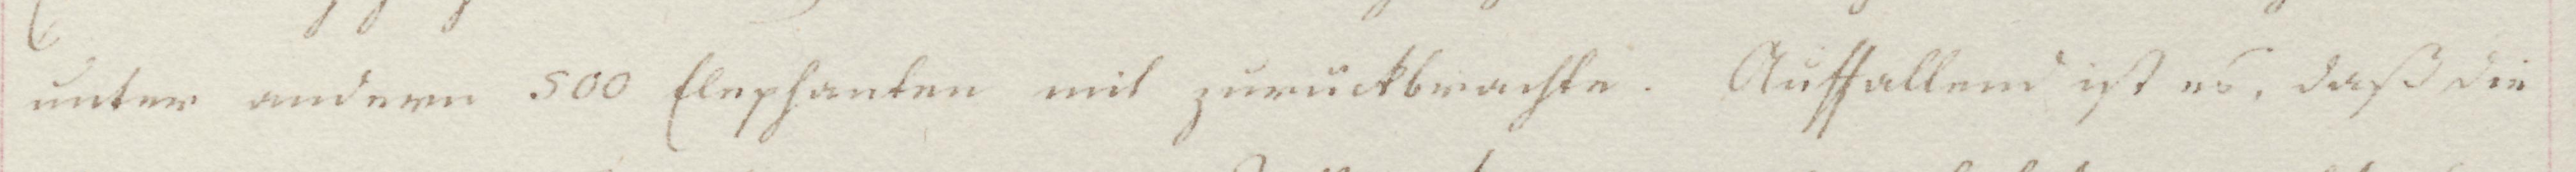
unter andern 500 Elephanten mit zurückbrachte. Auffallend ist es, daß die
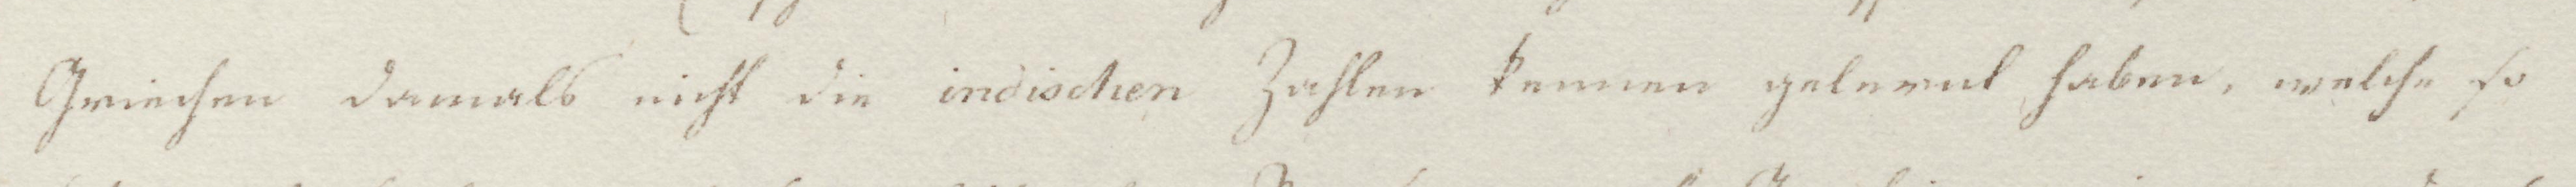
Griechen damals nicht die indischen Zahlen kennen gelernt haben, welche so
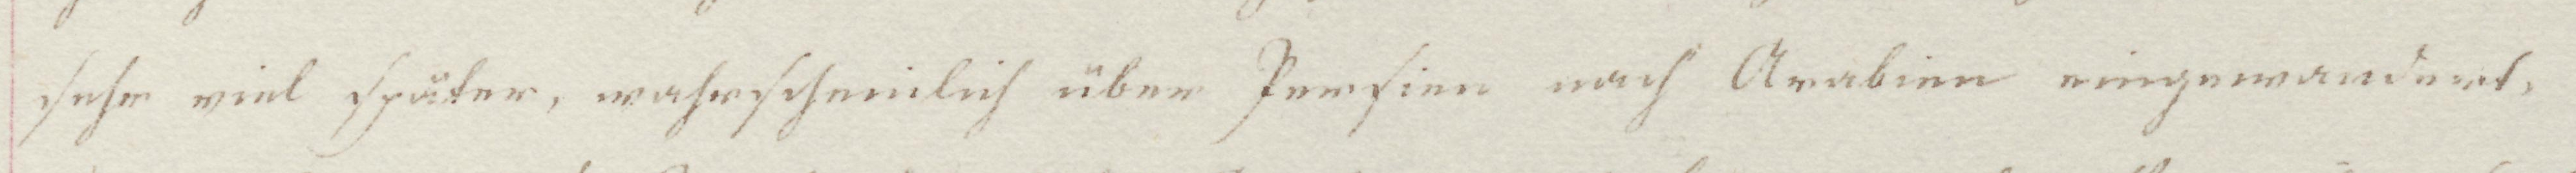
sehr viel später, wahrscheinlich über Persien nach Arabien eingewandert,
